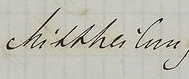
Mittheilung
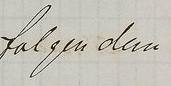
spricht sich in
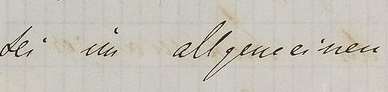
sei im Allgemeinen mit
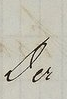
den
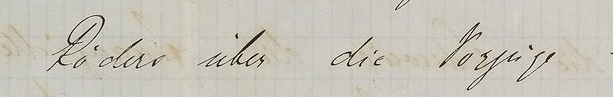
Röders über die Vorzüge
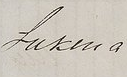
tei zu
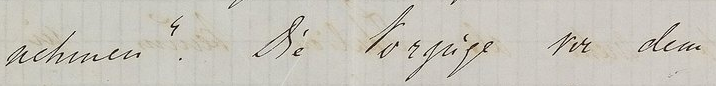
nehmen». Die Vorzüge vor dem
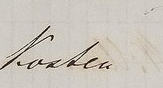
Kosten
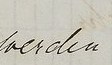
aufgewogen.
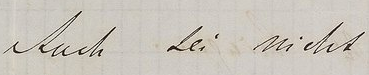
Auch sei nicht
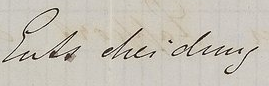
dass die Entscheidung
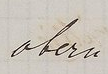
grossen
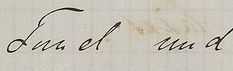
Tunel und
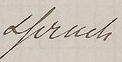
noch nicht
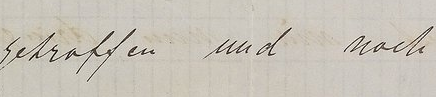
getroffen und noch
